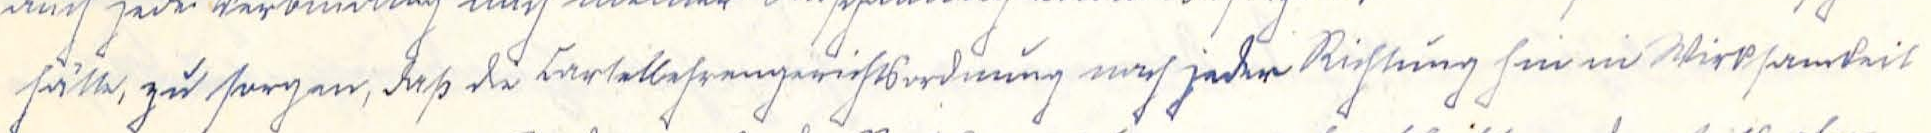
hätte, zu sorgen, daß die Cartellehrengerichtsordnung nach jeder Richtung frei in Wirksamkeit
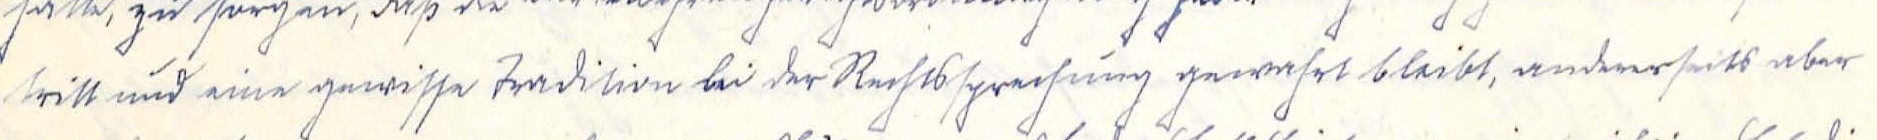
tritt und eine gewisse Tradition bei der Rechtssprechung gewahrt bleibt, andererseits aber
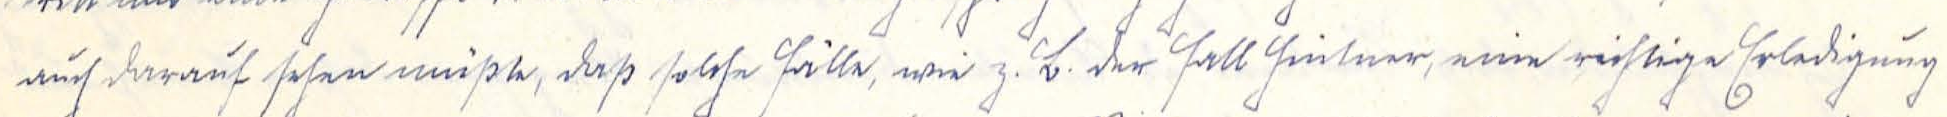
auch darauf sehen müßte, daß solche Fälle wie z. B. der Fall Hintner, eine richtige Erledigung
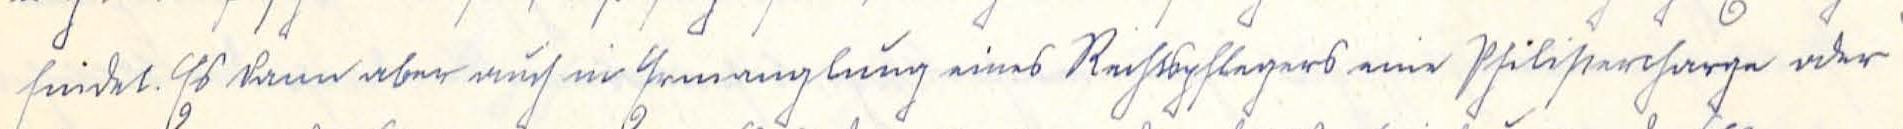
findet. Es kann aber auch in Ermangelung eines Rechtspfegers eine Philistercharge oder
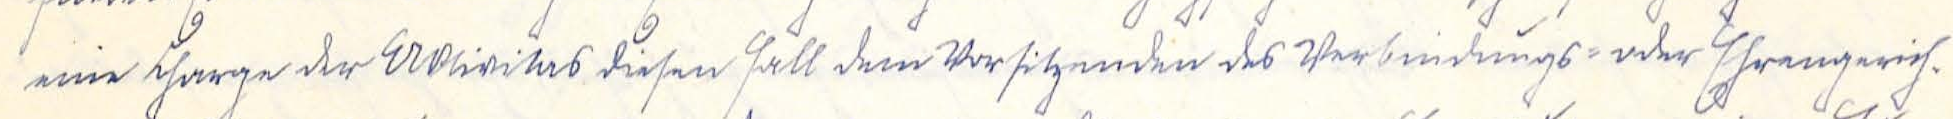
eine Charge der Aktivitas diesen Fall dem Vorsitzenden des Verbindungs- oder Ehrengerich-
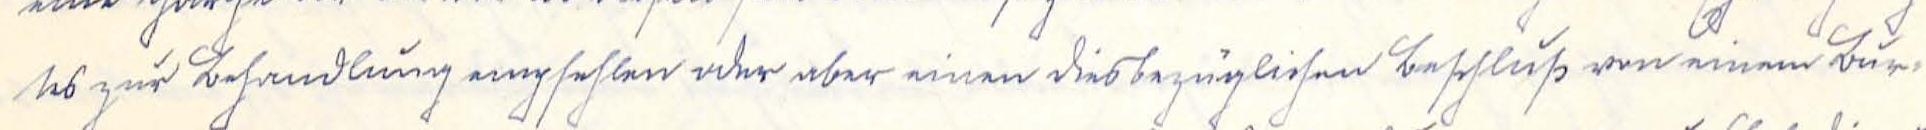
ts zur Behandlung empfehlen oder aber einen diesbezüglichen Beschluss von einem Bur-
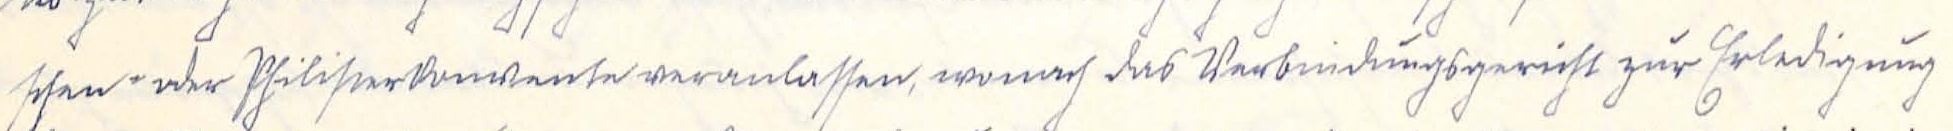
schen - oder Philisterkonvente veranlassen, worauf das Verbindunggericht zur Erledigung
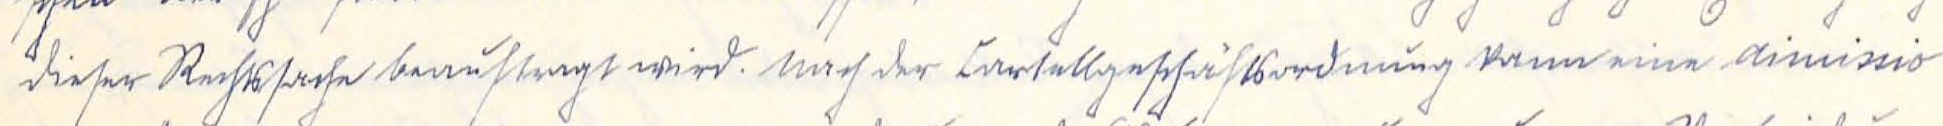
dieser Rechtssache beauftragt wird. Nach der Certellgeschäftsordnung kann eine dimissio
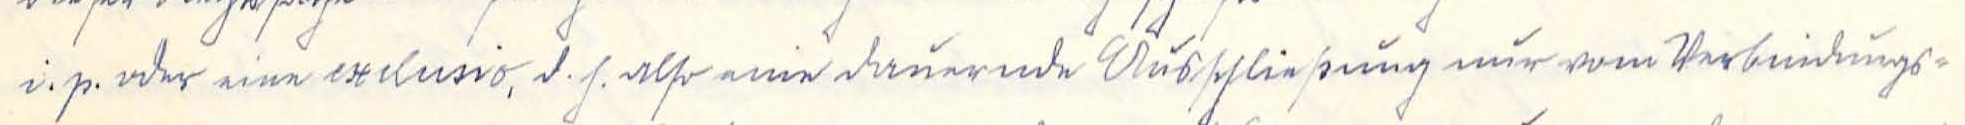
i. p. oder eine excluso d. h. also eine dauernde Ausschließung nur vom Verbindungs-
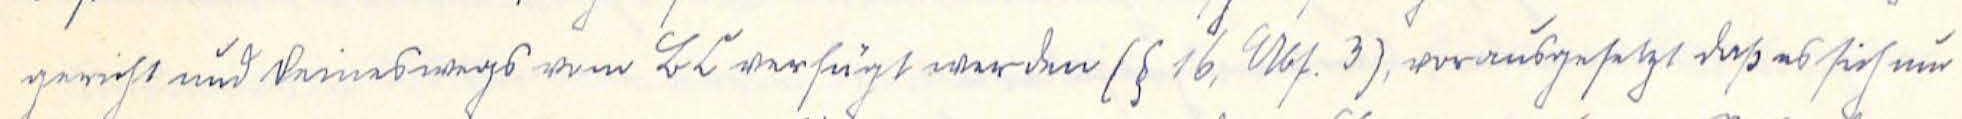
gericht und keineswegs vom BC verfügt werden (§16, Abs. 3), vorausgesetzt daß es sich um
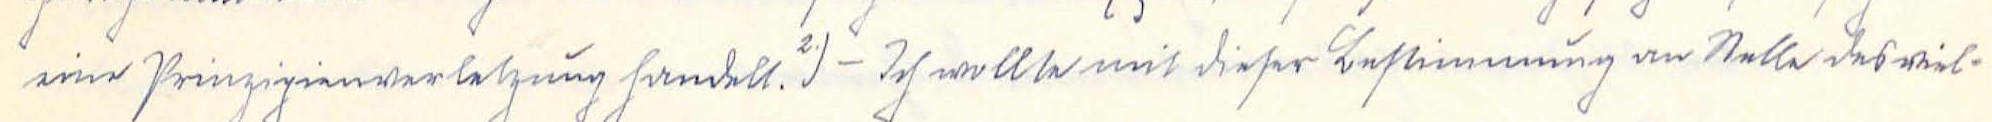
eine Prinzipienverletzung handelt 2.) - Ich wollte mit dieser Bestimmung an Stelle des viel-
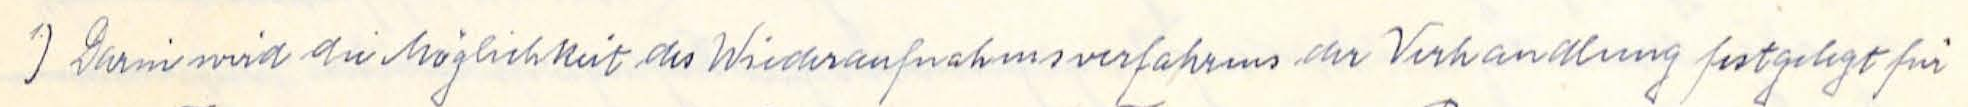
1.) Darin wird die Möglichkeit des Wiederaufnahmeverfahrens der Verhandlung festgelegt für
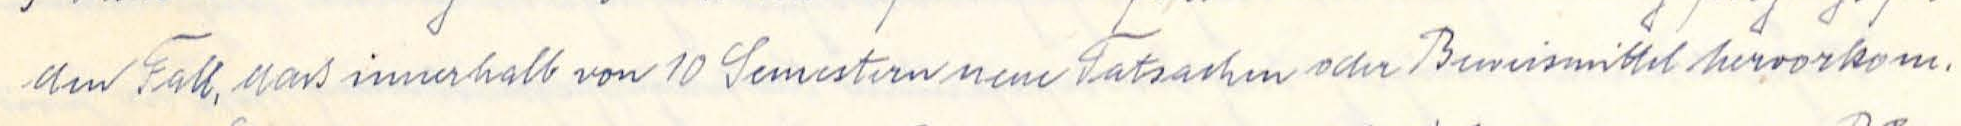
den Fall, dass innerhalb von 10 Semestern neue Tatsachen oder Beweismittel hervorkom-
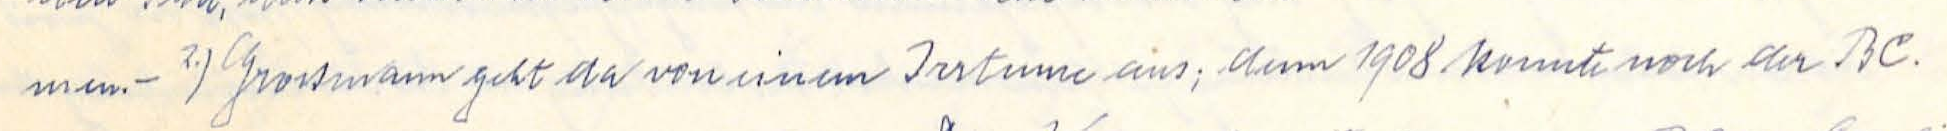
men.- 2.) Grossmann geht da von einem Irrtum aus, denn 1908 konnte noch der BC
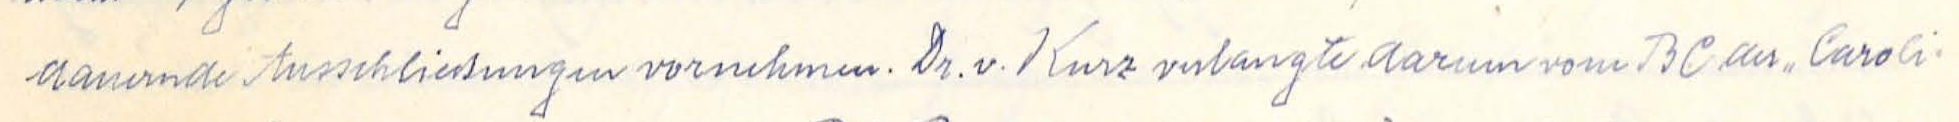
dauernde Ausschließungen vornehmen. Dr. v. Kurz verlangte darum vom BC der "Caroli-
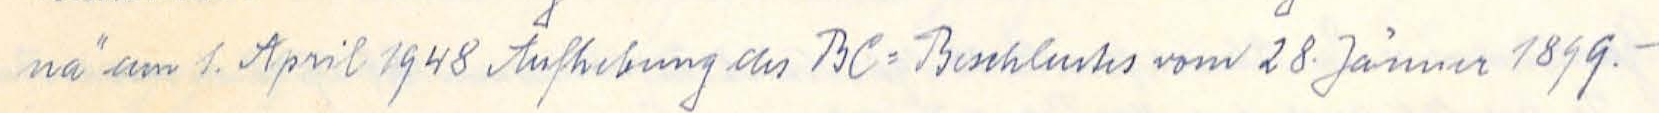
na" am 1. April 1948 Aufhebung des BC-Beschlusses vom 28. Jänner 1899.
